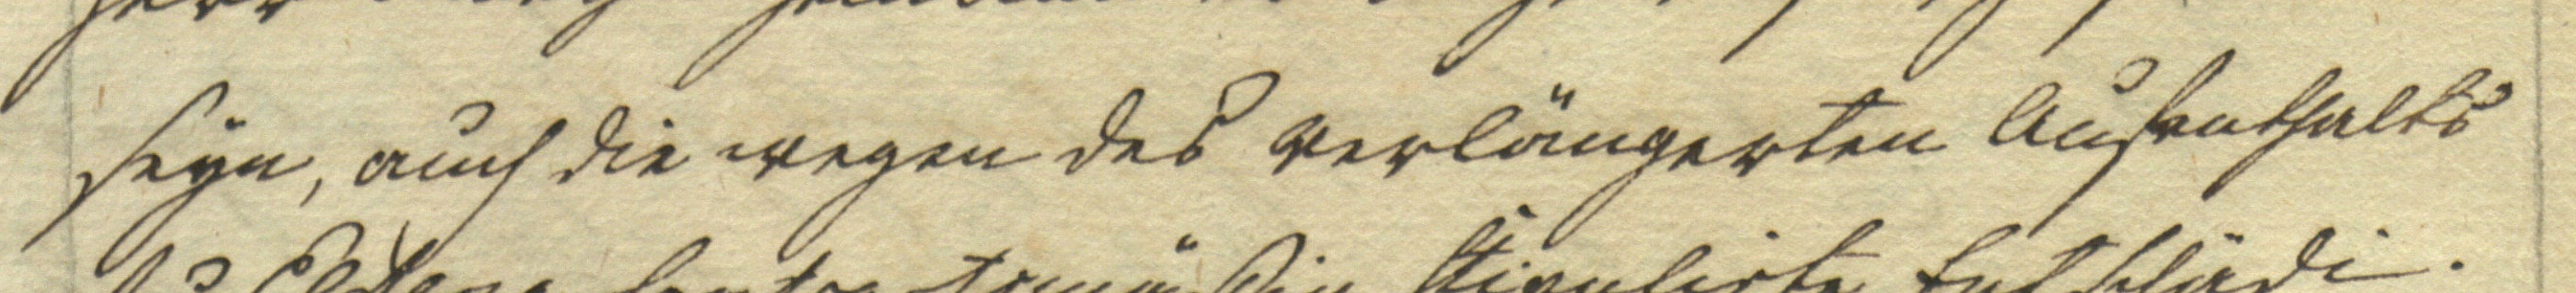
seÿn, auch die wegen des verlängerten Aufenthalts
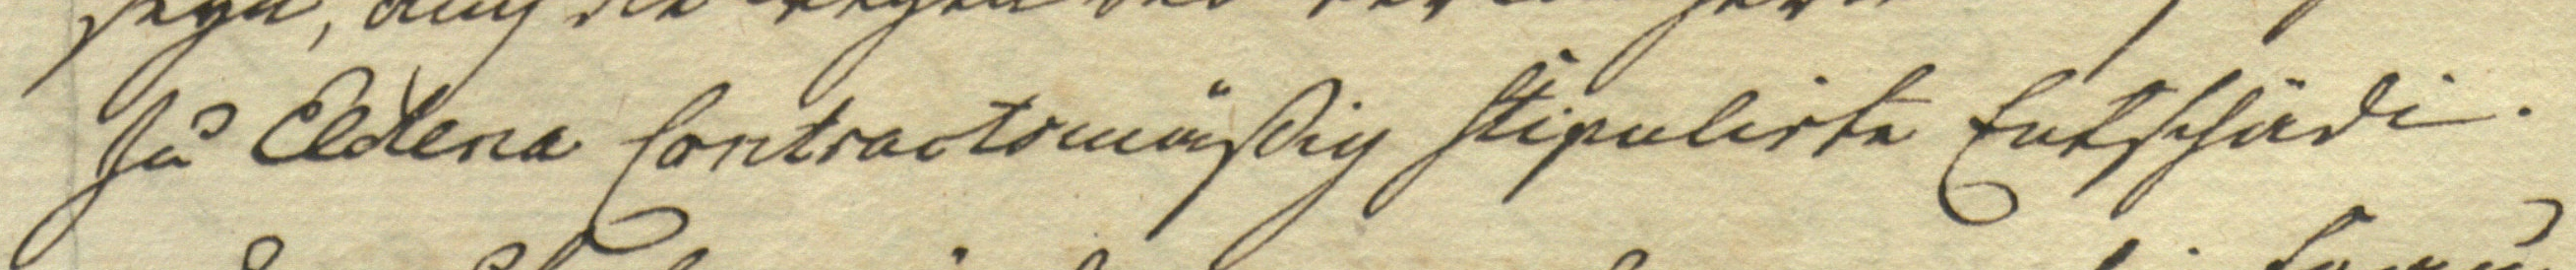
zu Eldena Contractsmäßig stipulirte Entschädi¬
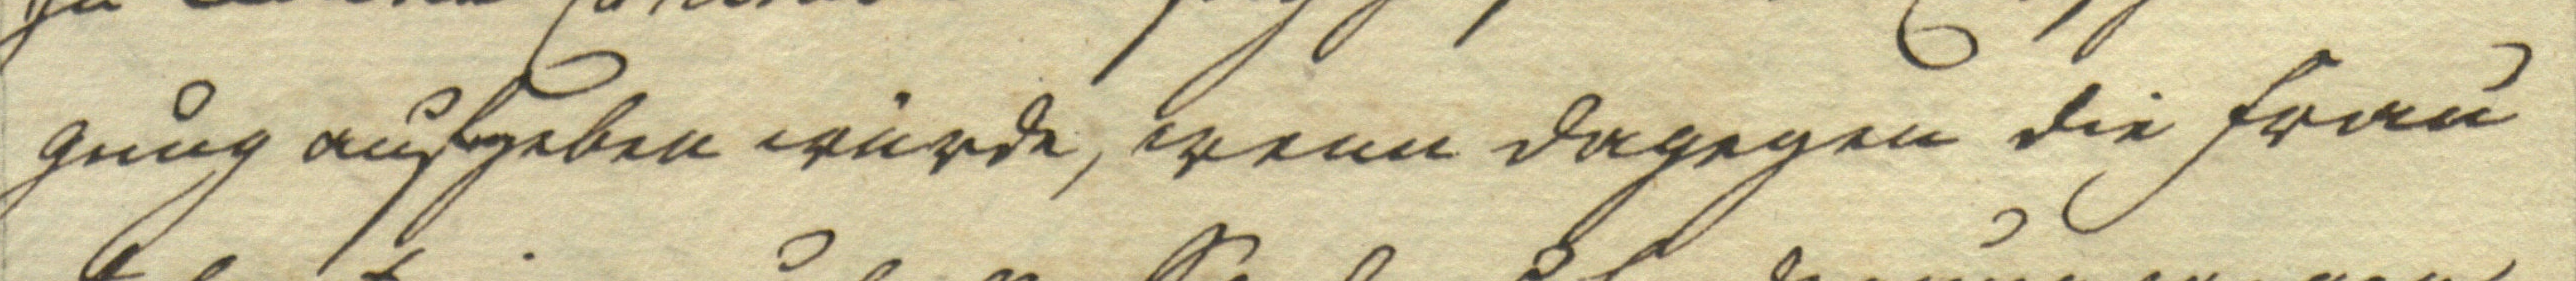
gung aufgeben würde, wenn dagegen die Frau
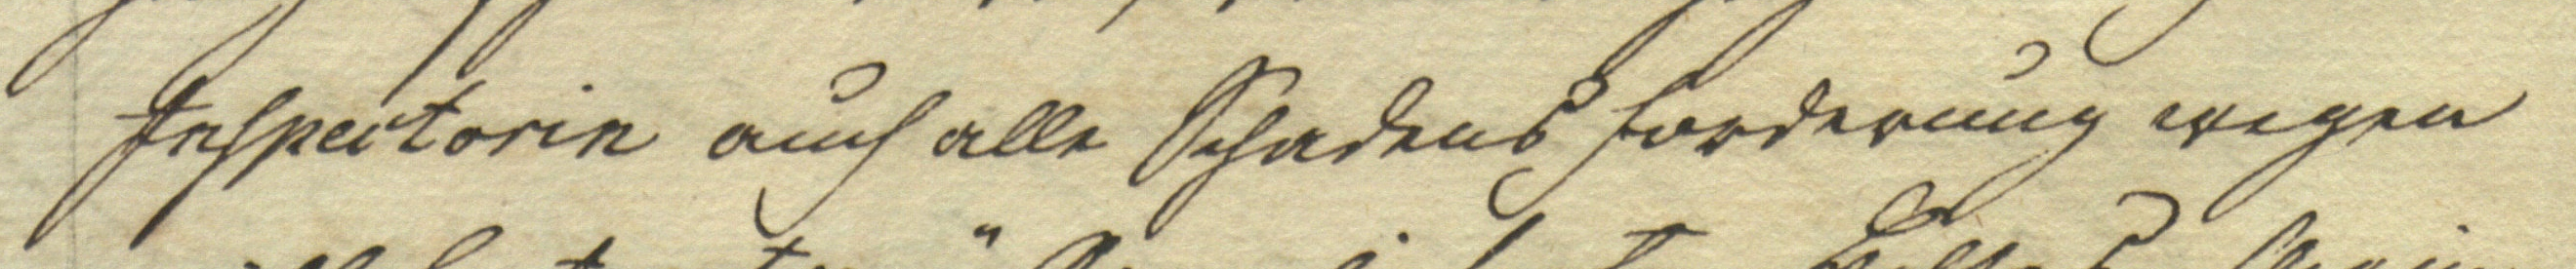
Inspectorin auch alle Schadens Forderung wegen
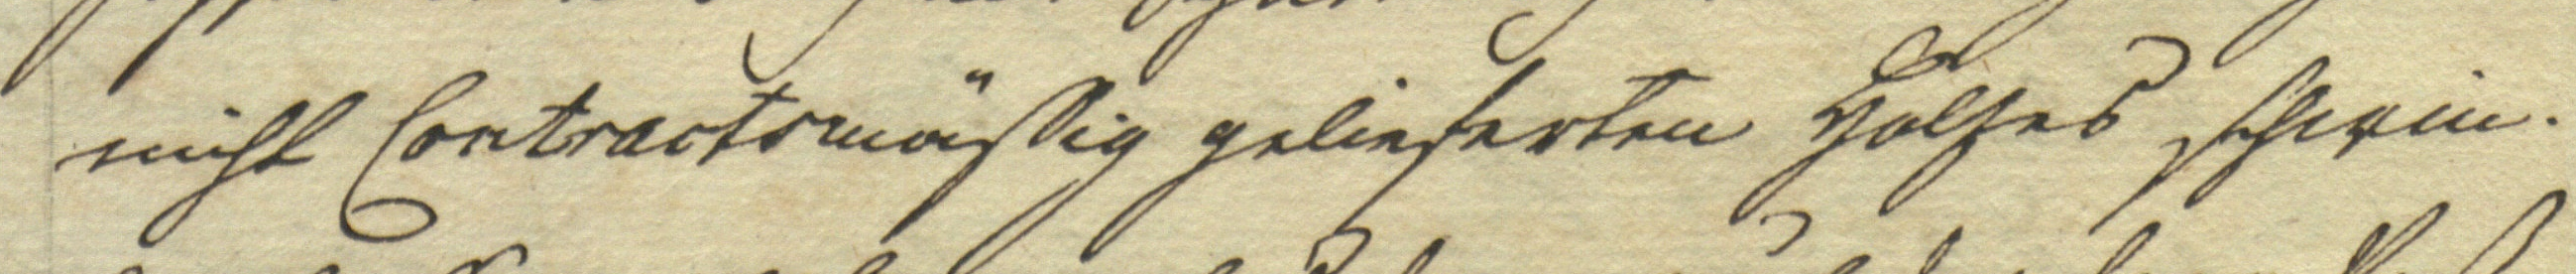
nicht Contractsmäßig gelieferten Holzes schwin¬
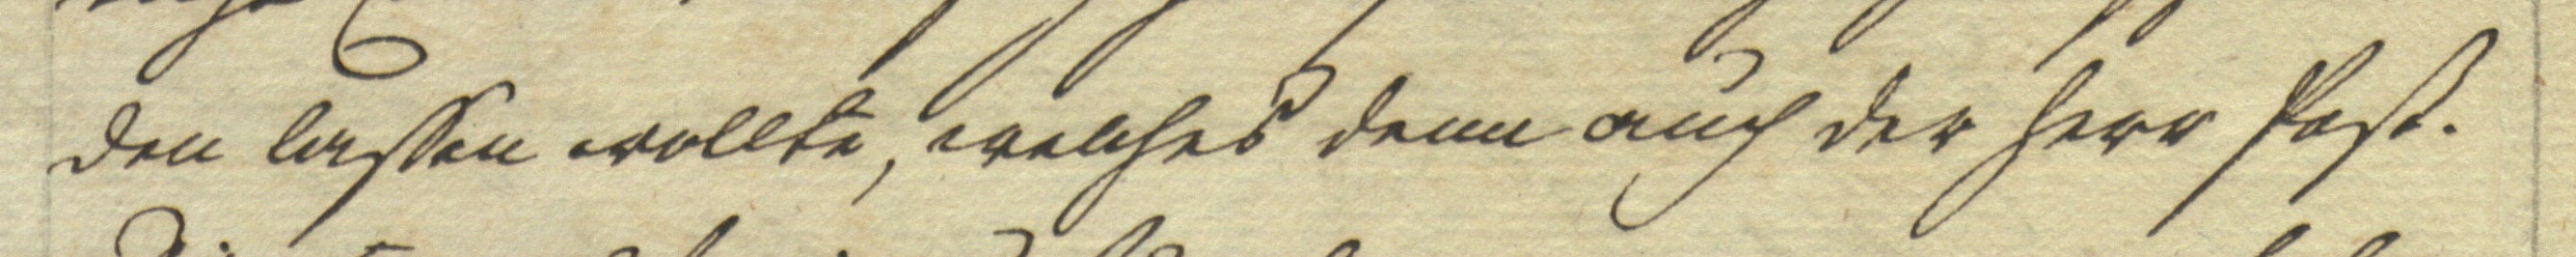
den lassen wollte, welches denn auch der Herr Post¬
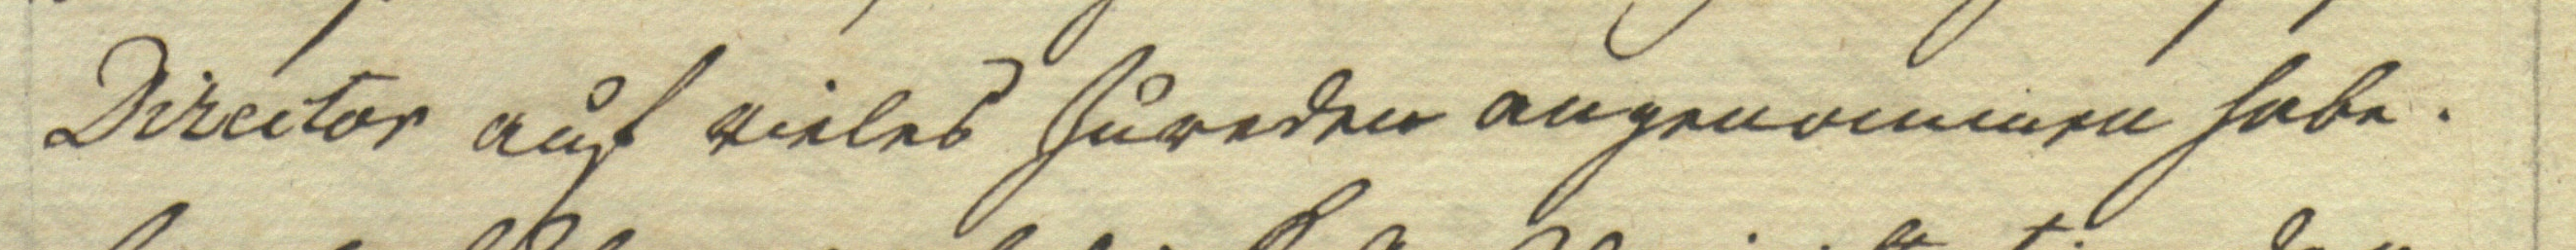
Director auf vieles Zureden angenommen habe.
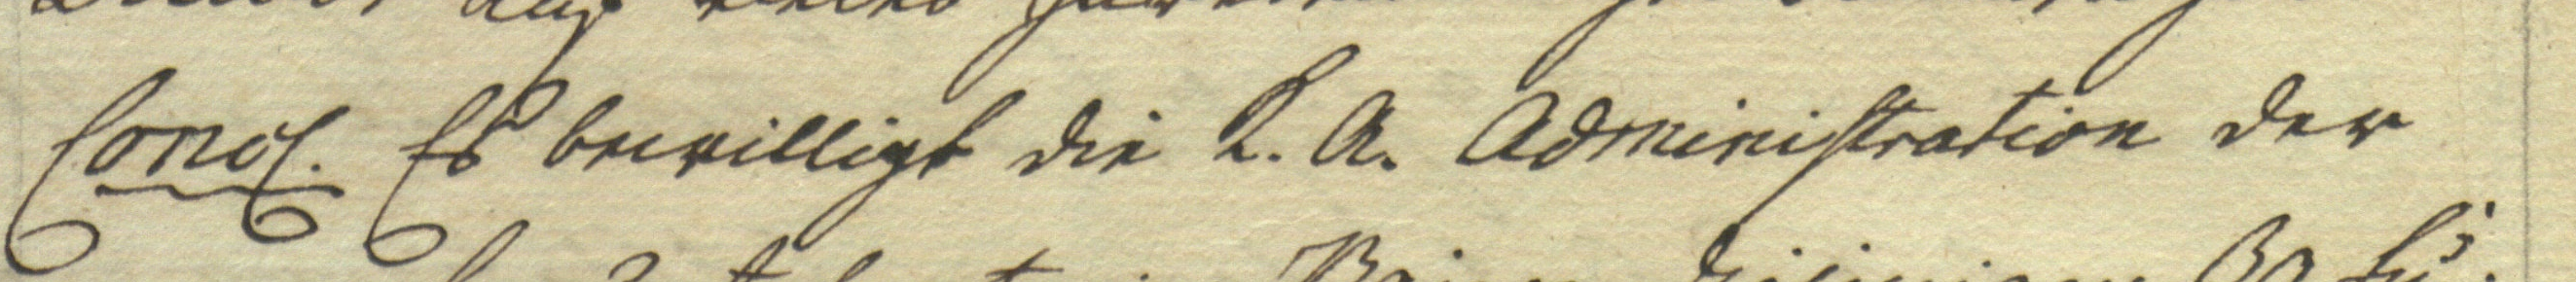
Concl. Es bewilligt die K. A. Administration der
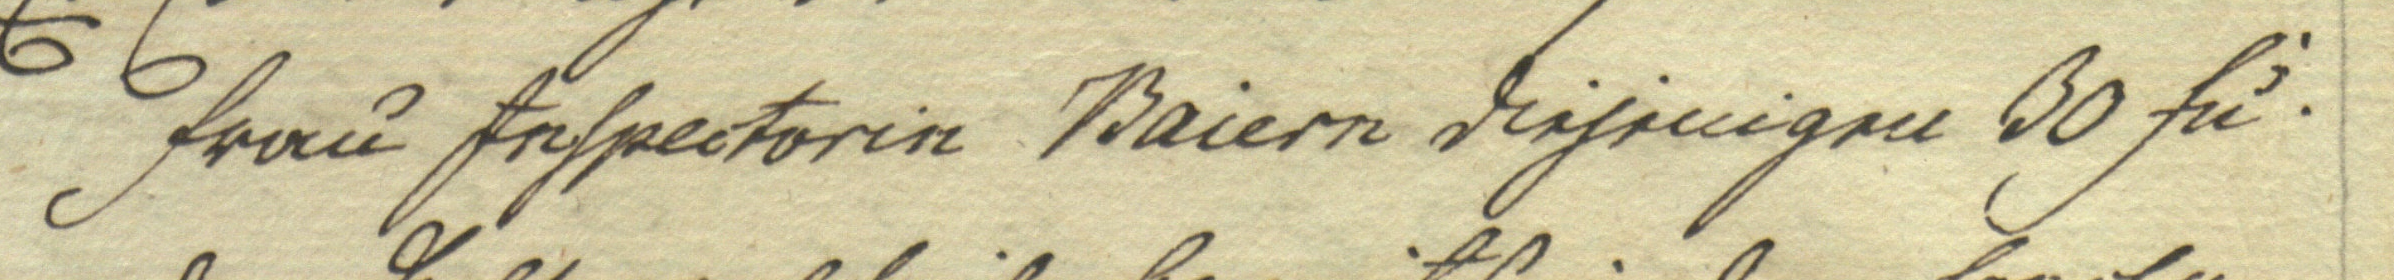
Frau Inspectorin Baiern diejenigen 30 Fu¬
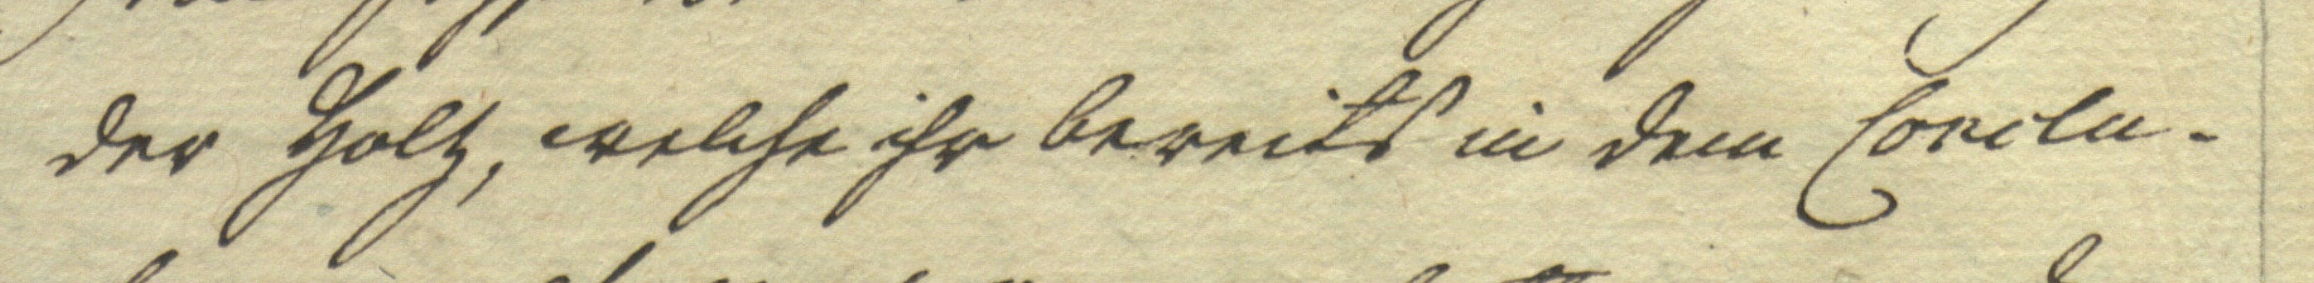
der Holz, welche ihr bereits in dem Conclu¬
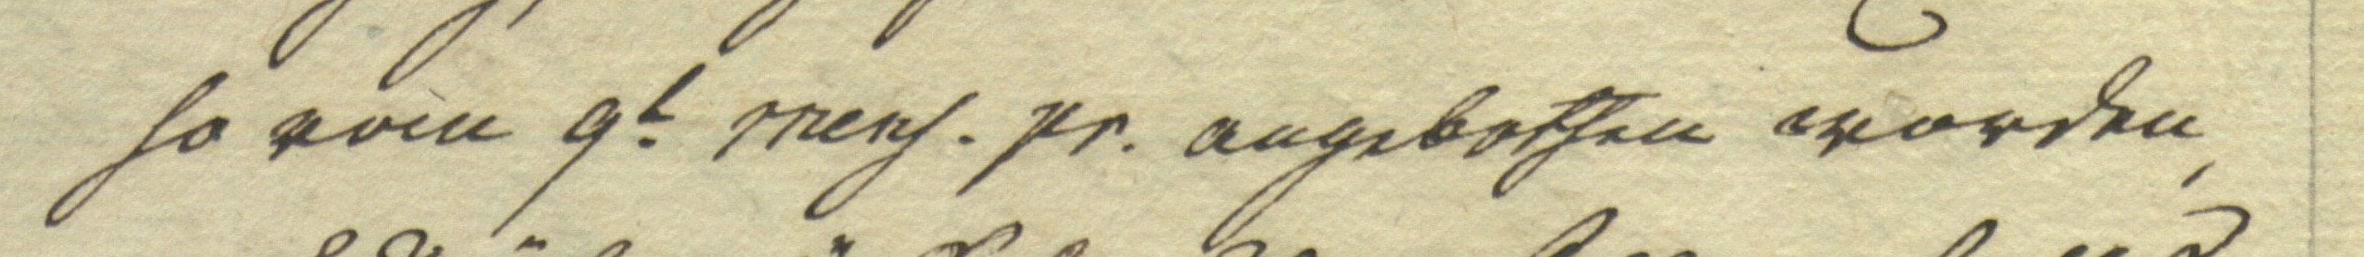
so vom 9 t mens. pr. angebothen worden,
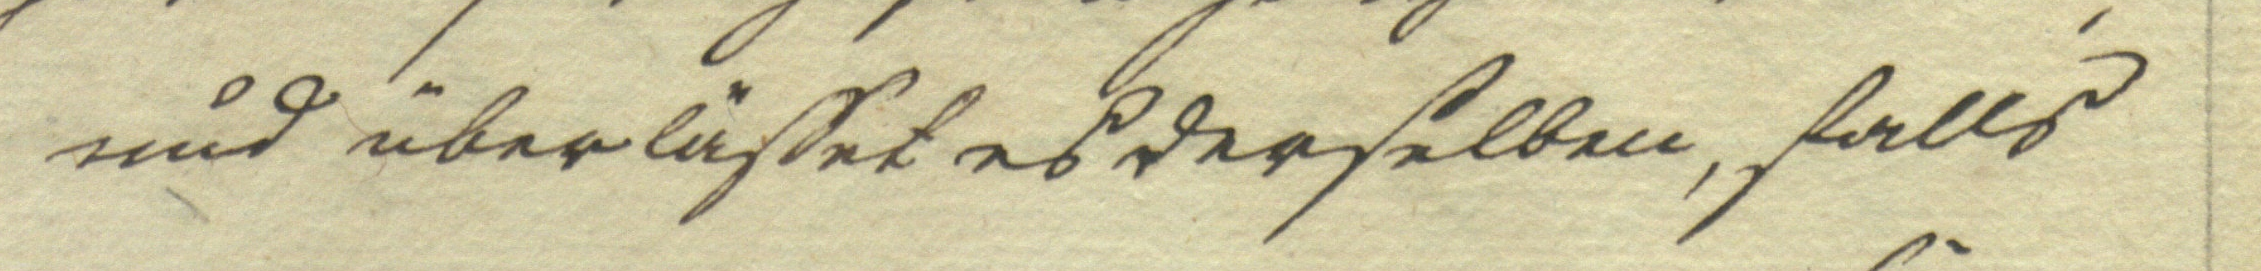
und überlässet es derselben, falls
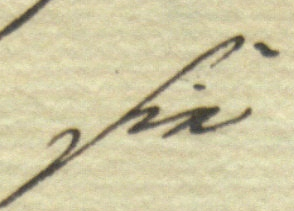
sie
